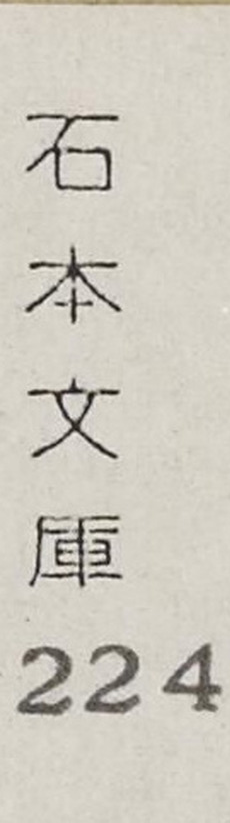石本文庫

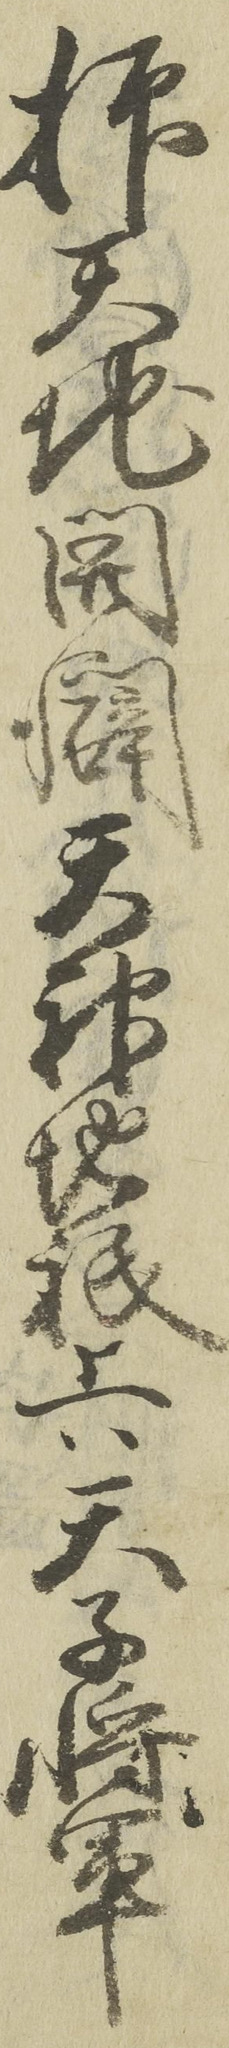抑天地開闢天神地祇上ハ天子将軍
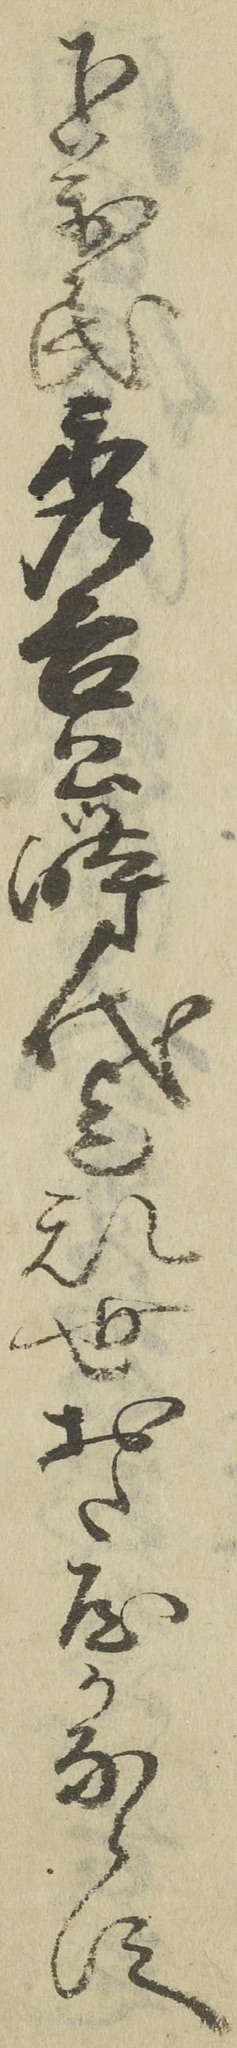下ハ万民秀吉公御時代迄乱世おたやかならす
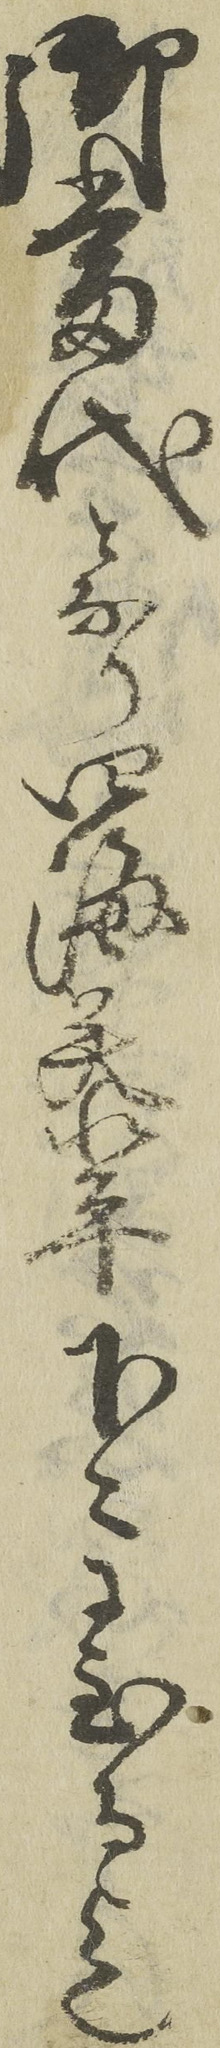御当代となり四海泰平下々に至る迄
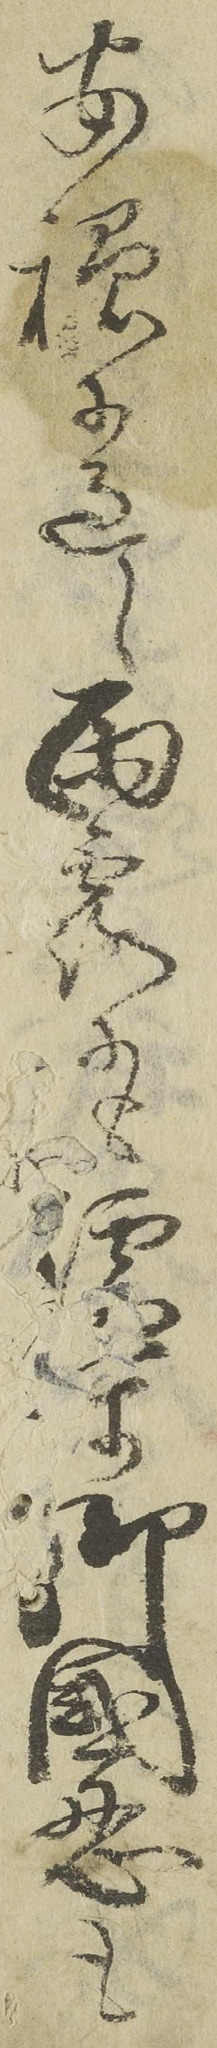安穏に過し雨露にも濡す御国恩も
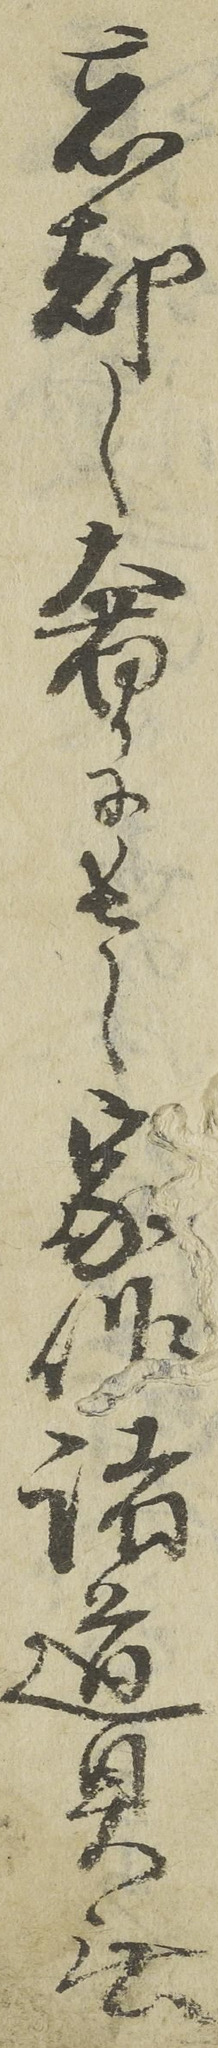忘却し奢りに長し家作諸道具無
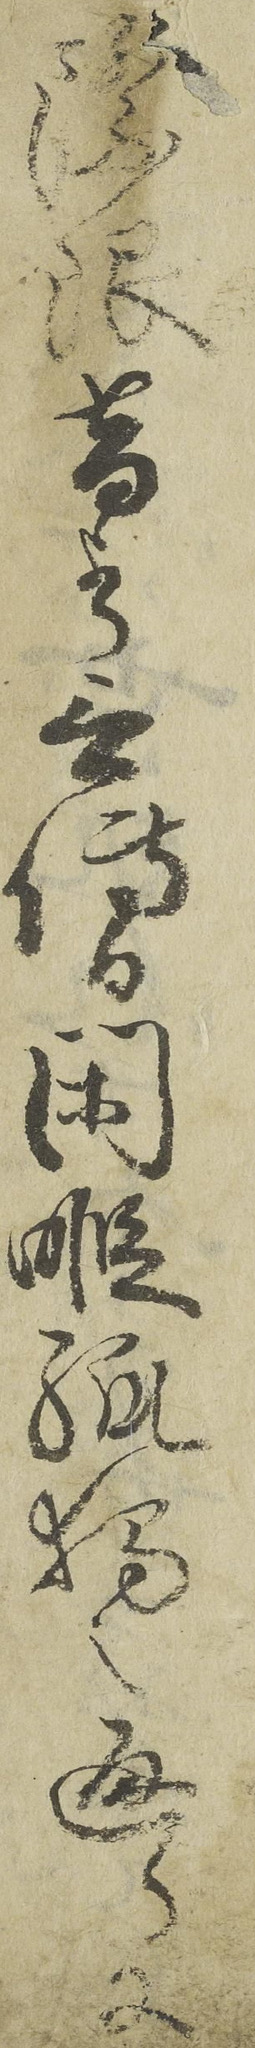際限昔より言伝る閑暇孤独之通りに

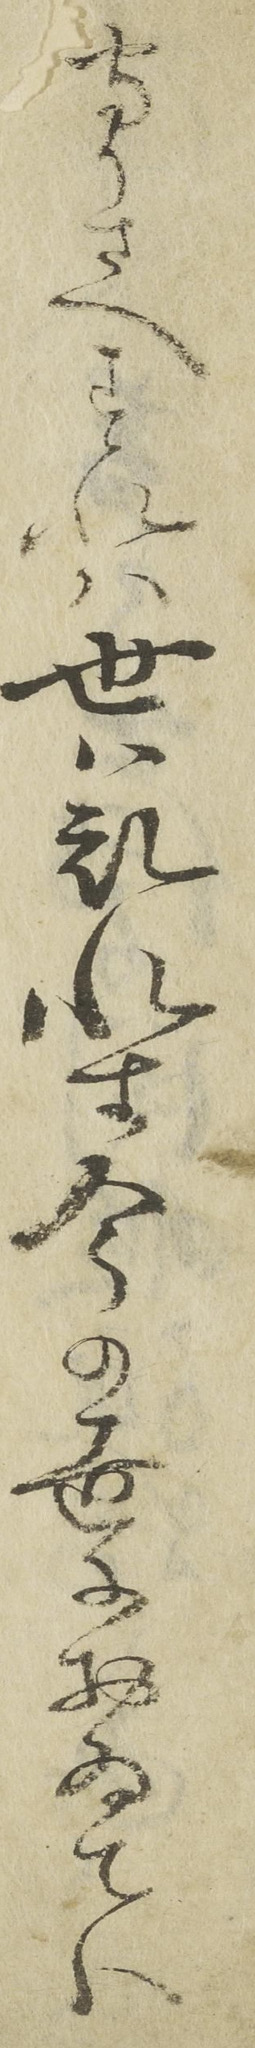守りさへすれハ世ハ乱れす今の世におゐてハ
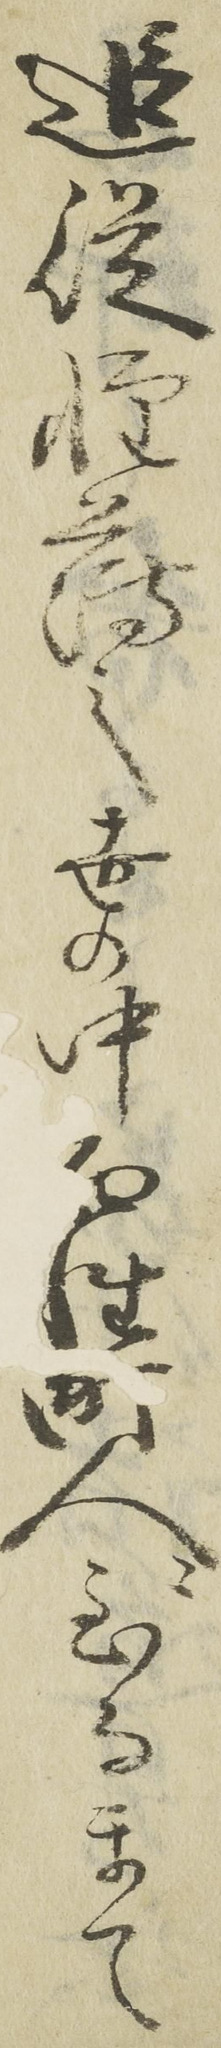追従軽薄之世の中百姓町人ニ至るまて
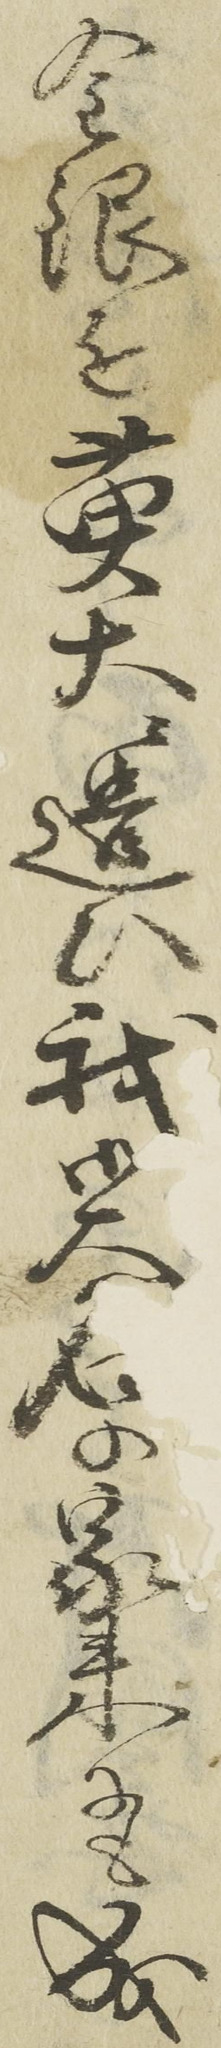金銀を莫大ニ遣ひ我御大名の家来にも成
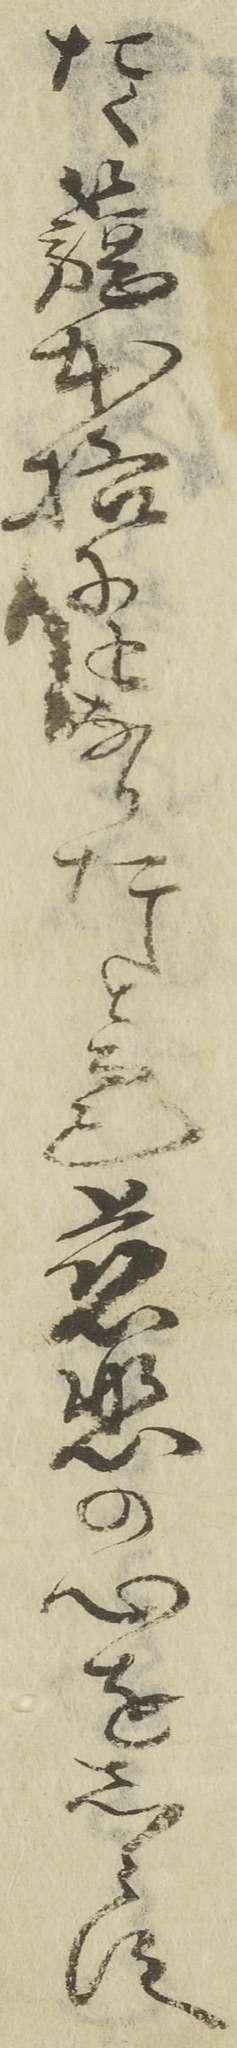たく籏本格にもなりたしと而巳慈悲の心をしらす
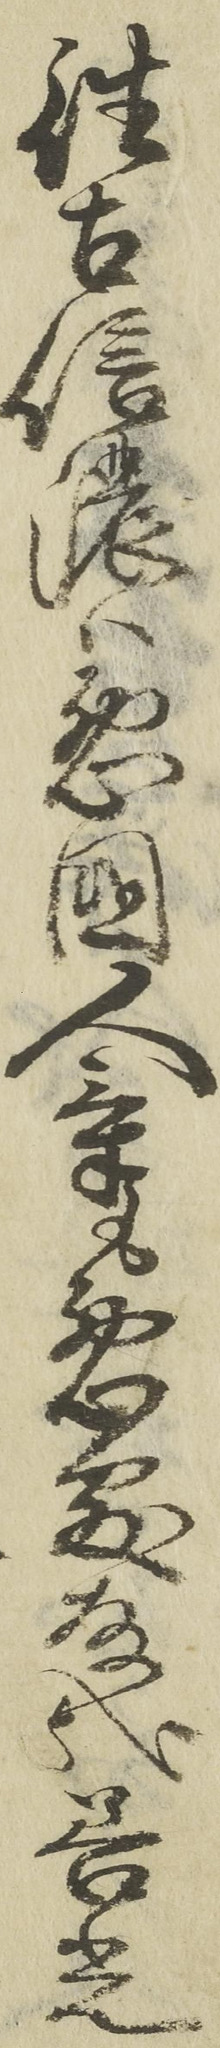往古信濃ハ悪国人気も悪敷故哉善光
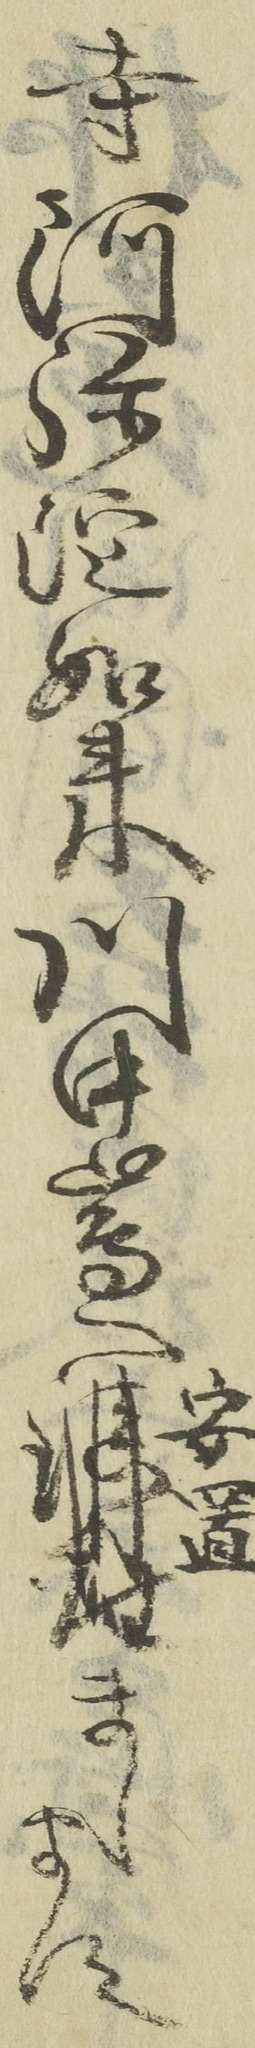寺阿弥陀如来川中島へ安置まします
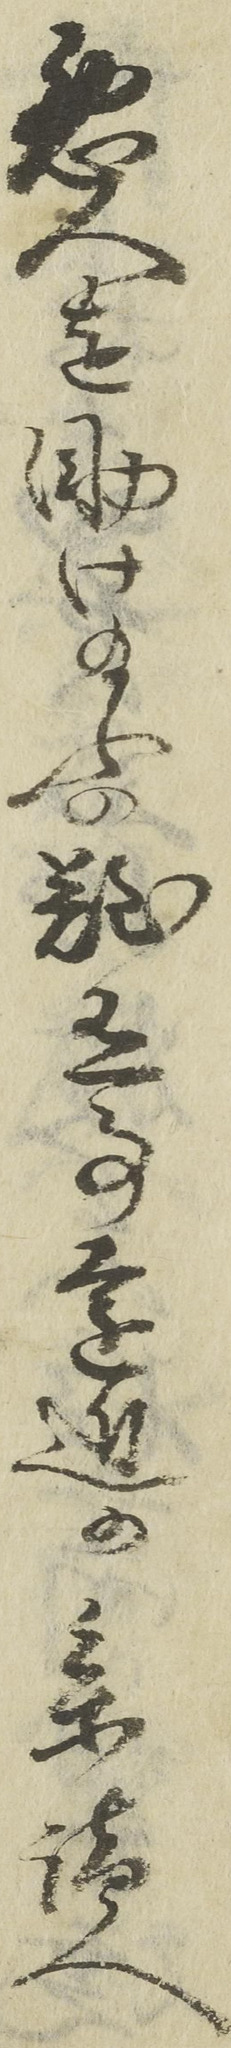悪人を助け給ふの難有事遠近の参詣人
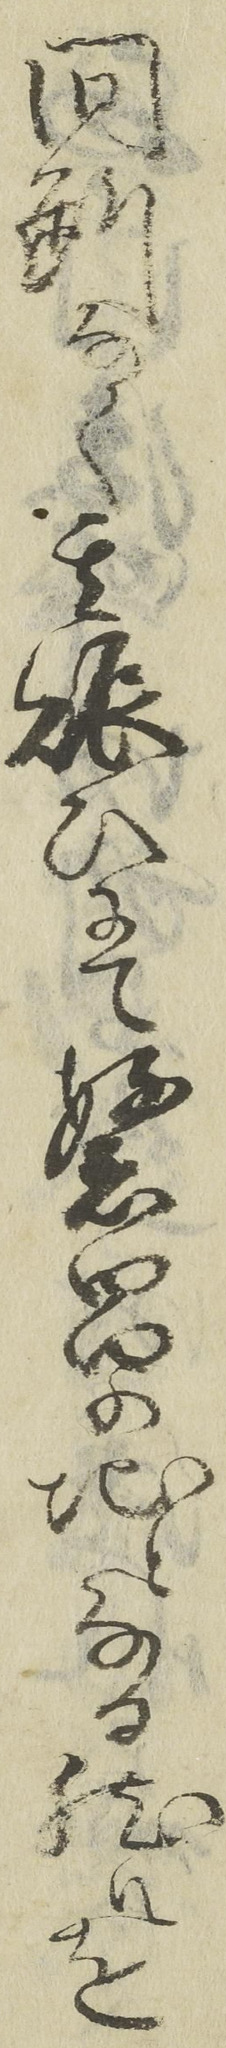間断なく其賑ひにて繁昌の地となる然ルを
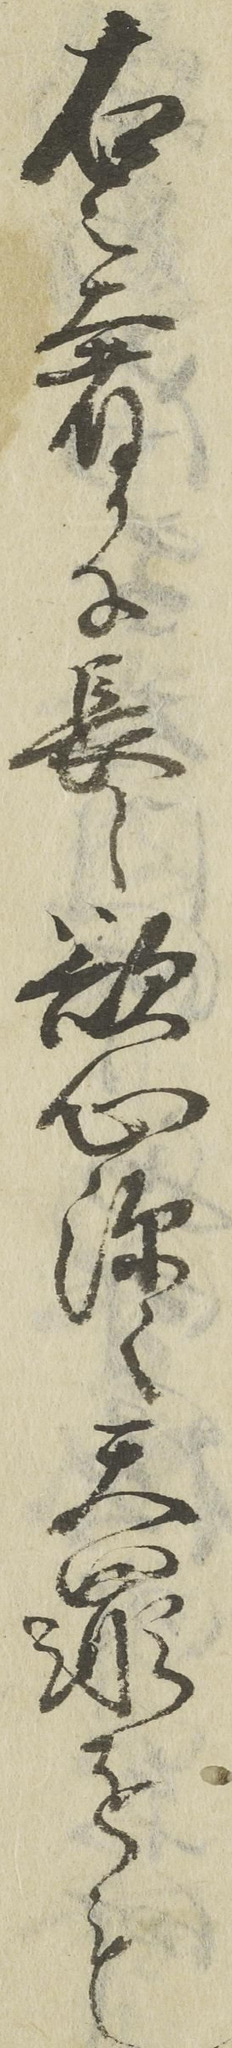右之奢りに長し欲心深く天罪をも
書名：弘化四　大地震由来　全
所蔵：東京大学地震研究所図書室 Earthquake Research Institute Library, The University of Tokyo, JAPAN
